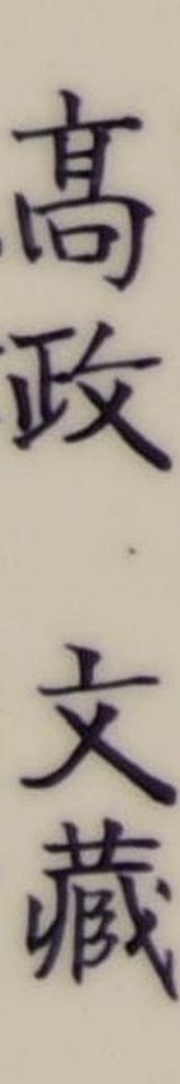高政文蔵
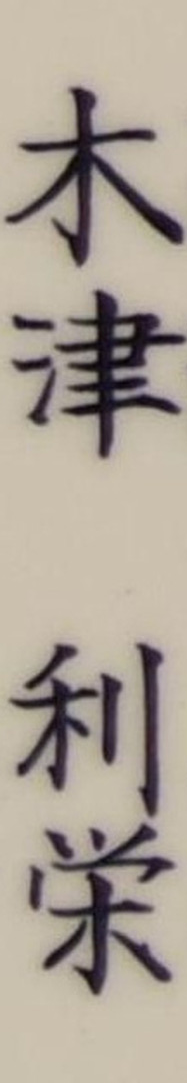木津利栄
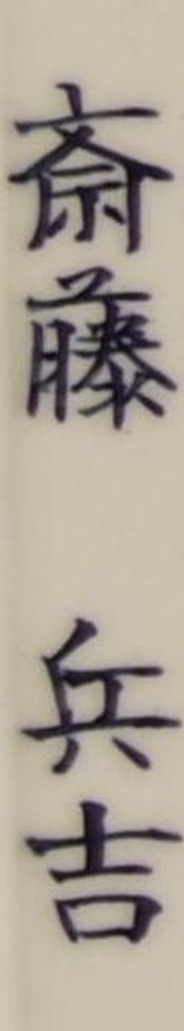斉藤兵吉

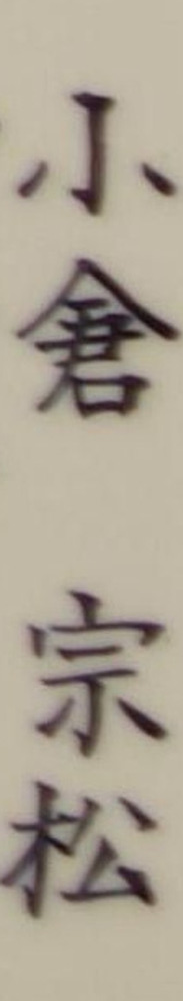小倉宗松
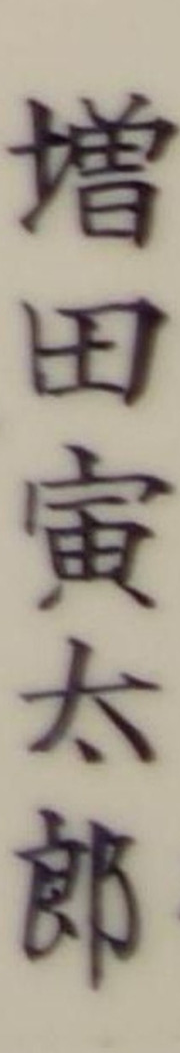増田寅太郎
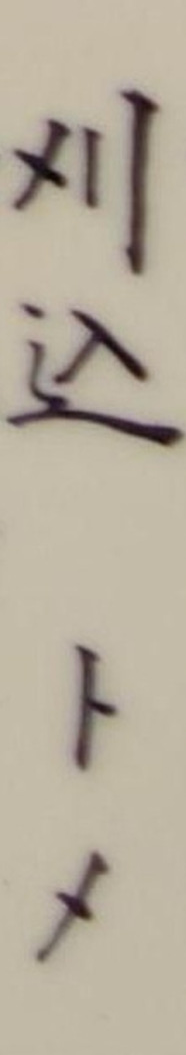刈込トメ
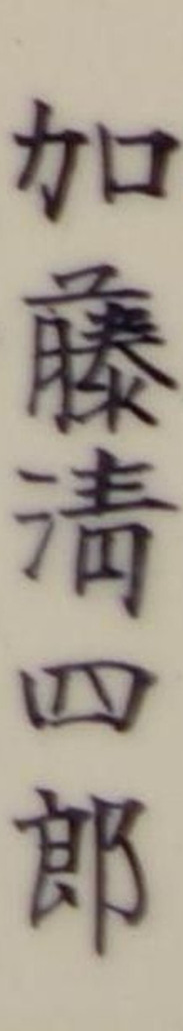加藤清四郎
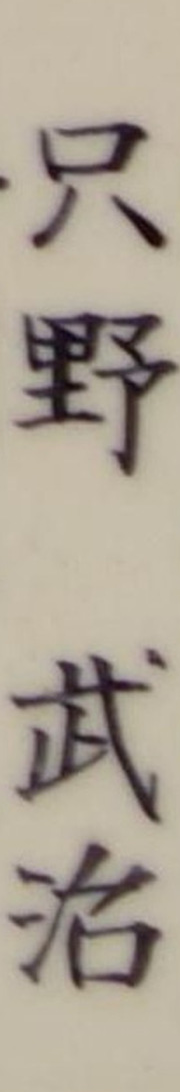只野武治
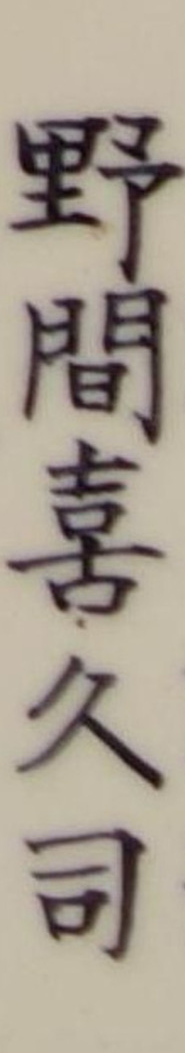野間喜久司
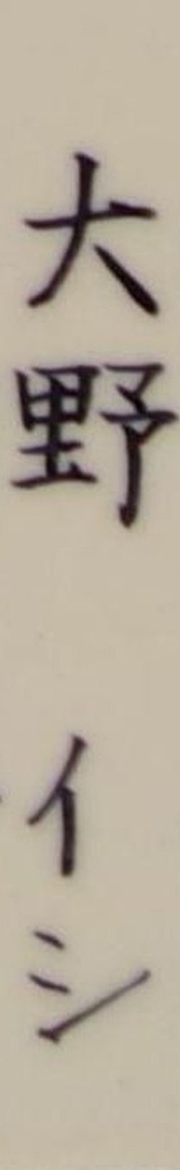大野イシ
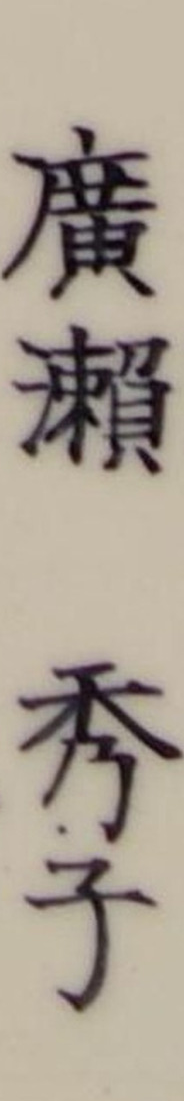廣瀬秀子
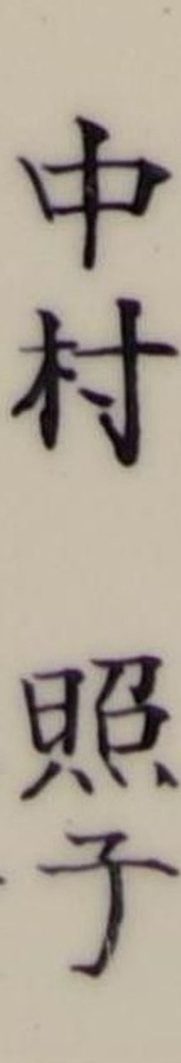中村照子
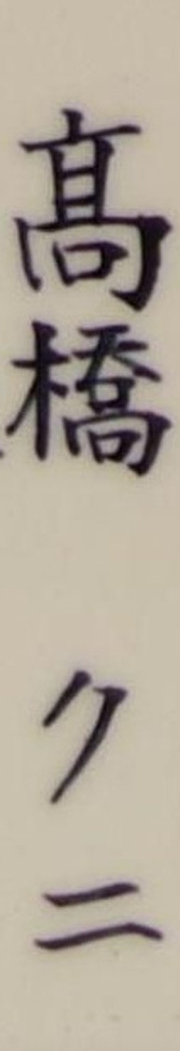高橋ク二
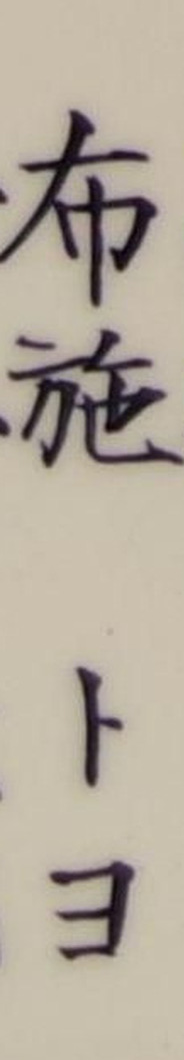布施トヨ
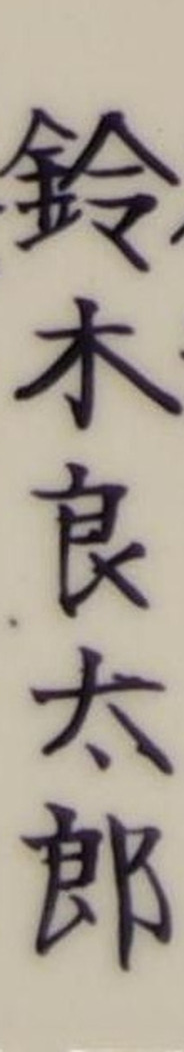鈴木良太郎
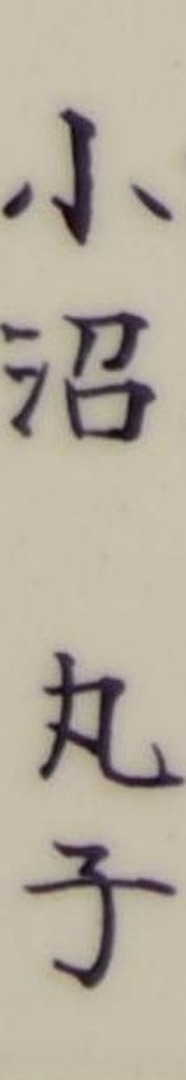小沼丸子
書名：M~S
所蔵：高野山金剛峯寺
